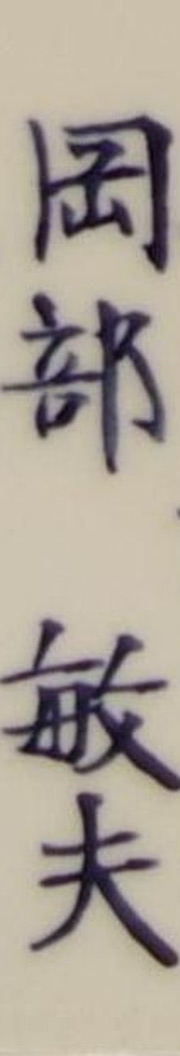岡部敏夫
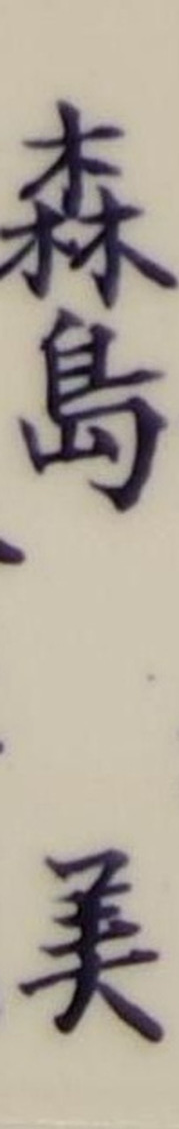森島美

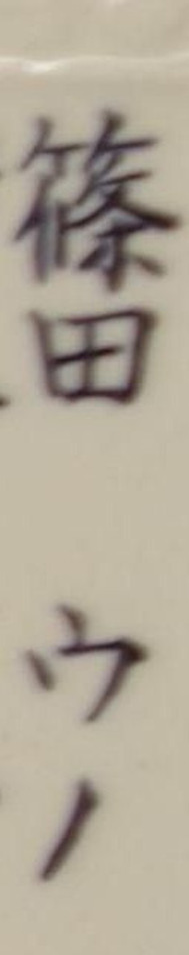篠田ウノ
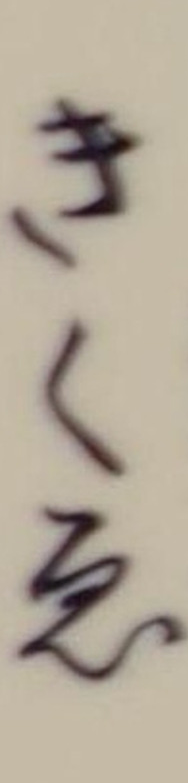きくゑ
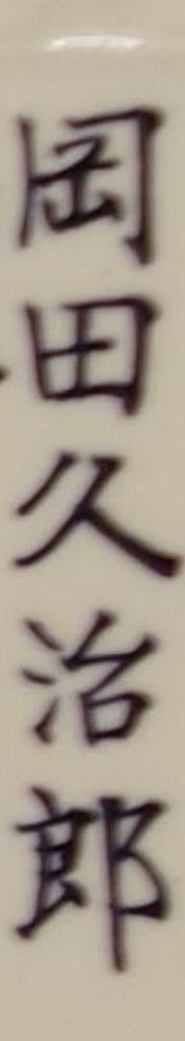岡田久治郎
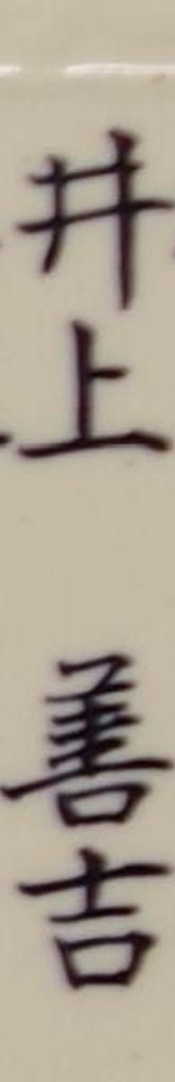井上善吉
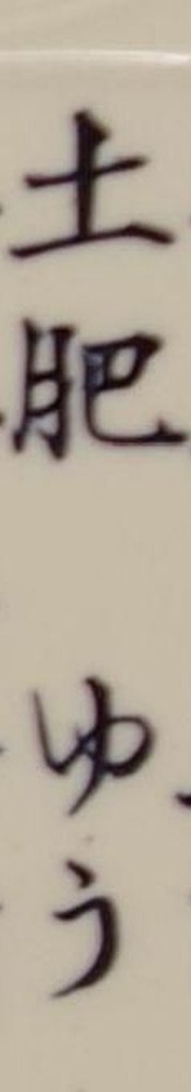土肥ゆう
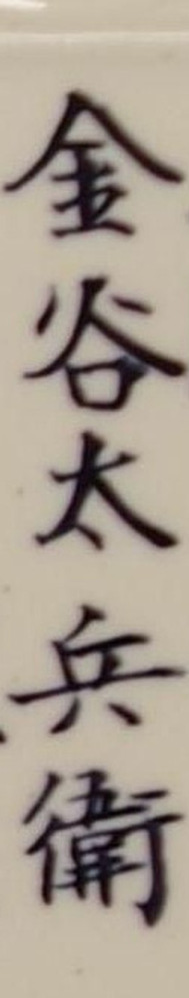金谷太兵衛
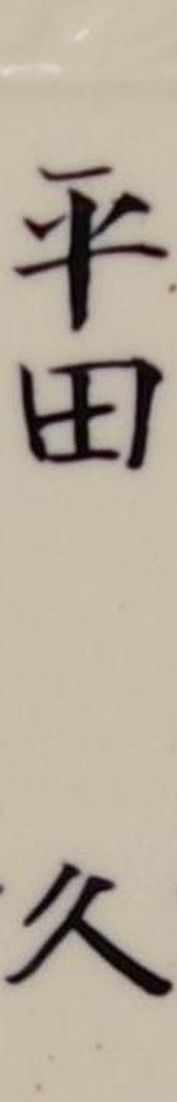平田久
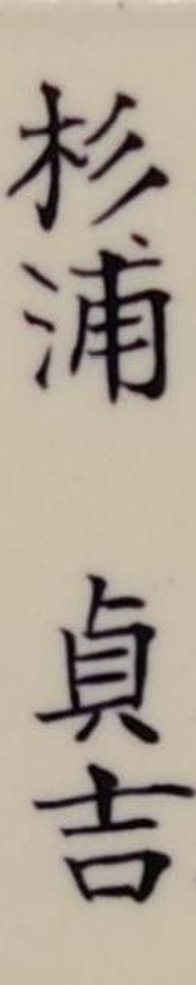杉浦貞吉
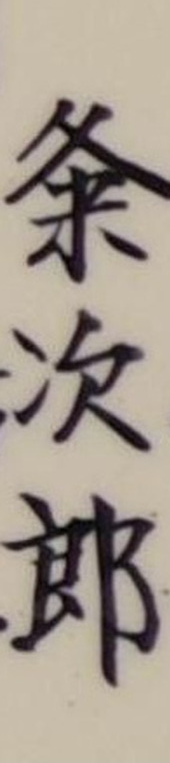粂次郎
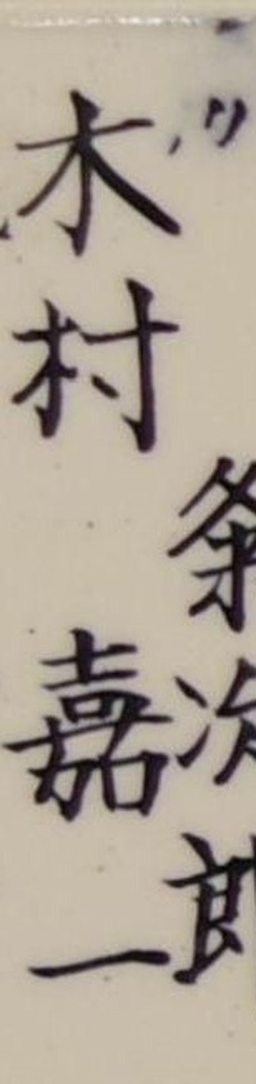木村嘉一
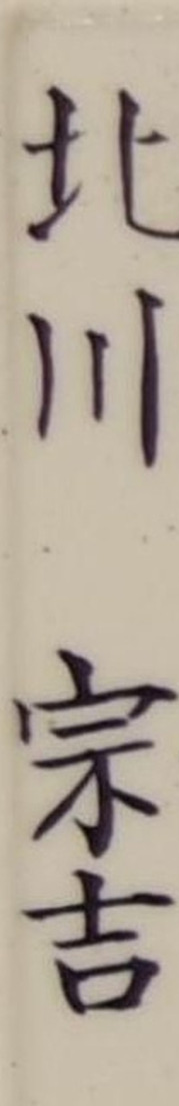北川宗吉

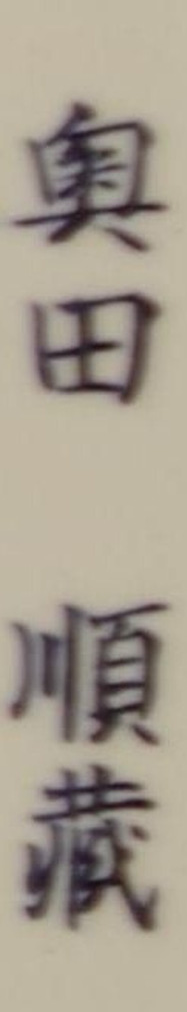奥田順蔵
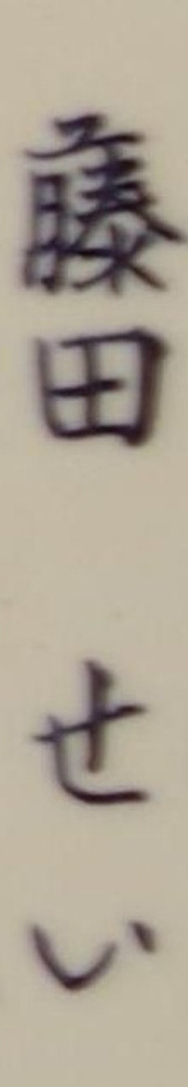藤田せい
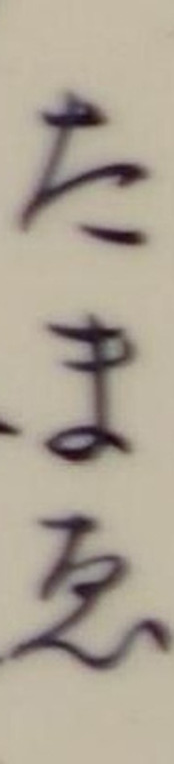たまゑ
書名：M~S
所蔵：高野山金剛峯寺
